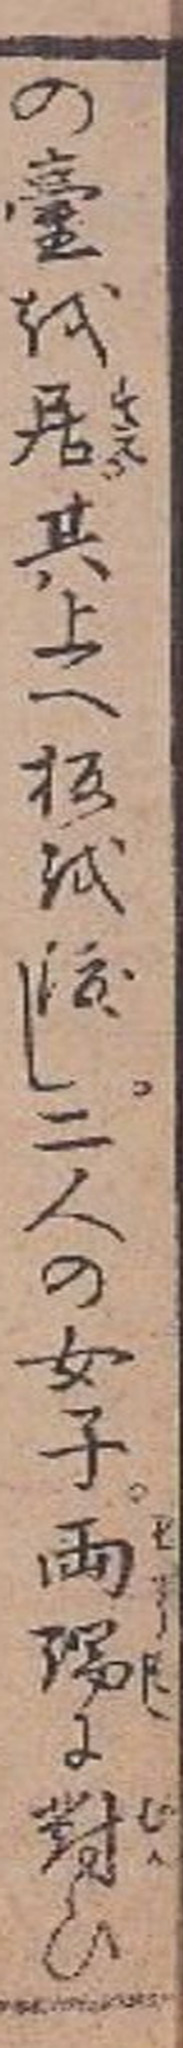の台を居、其上へ板を渡し、二人の女子、両端に対ひ
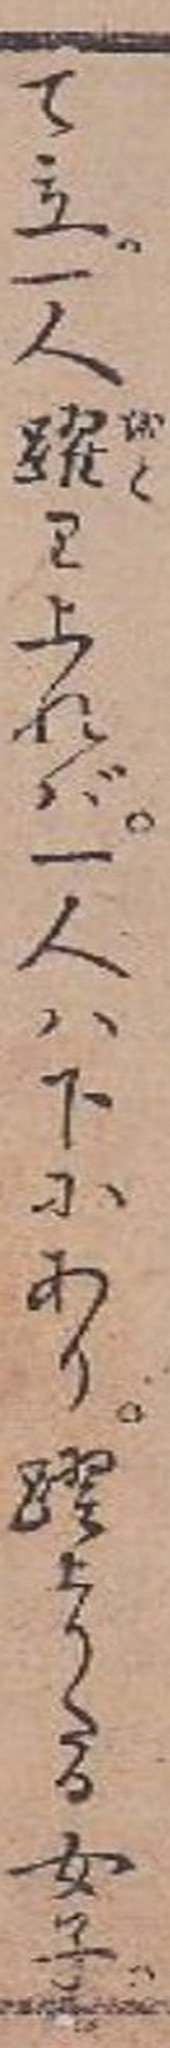て立、一人躍り上れば、一人は下にあり、躍上りたる女子、
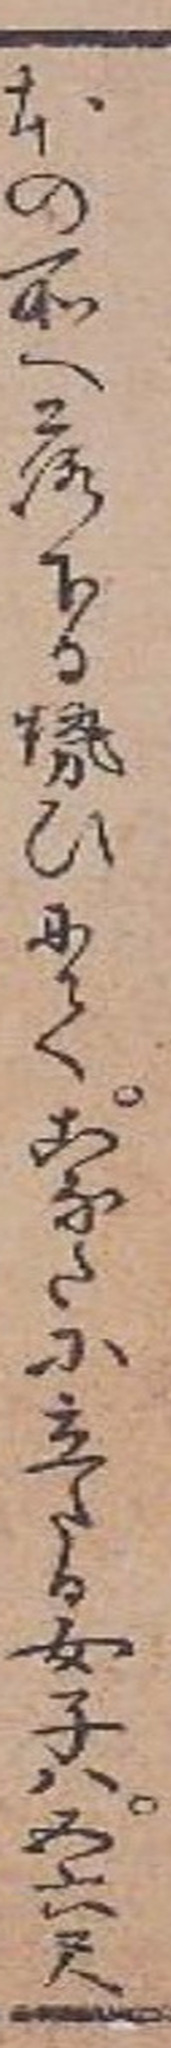本の所へ落下る勢ひにて、こなたに立たる女子は、五六尺
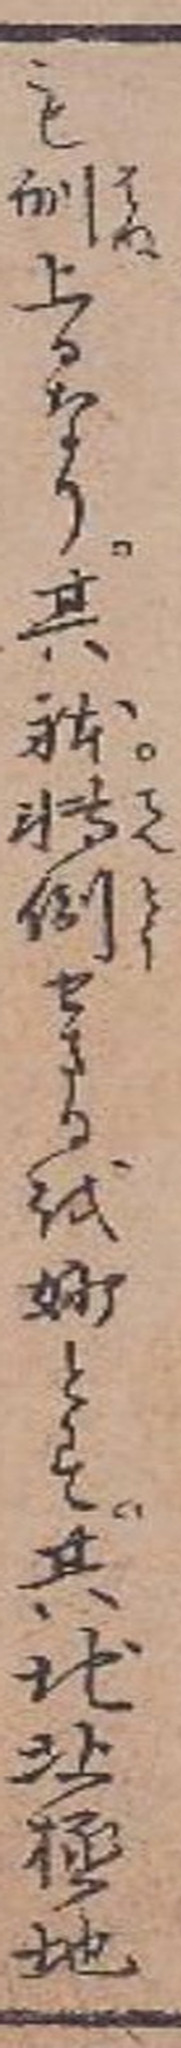も刎上るなり、其躰、転倒せさるを妙とす、其地北極地
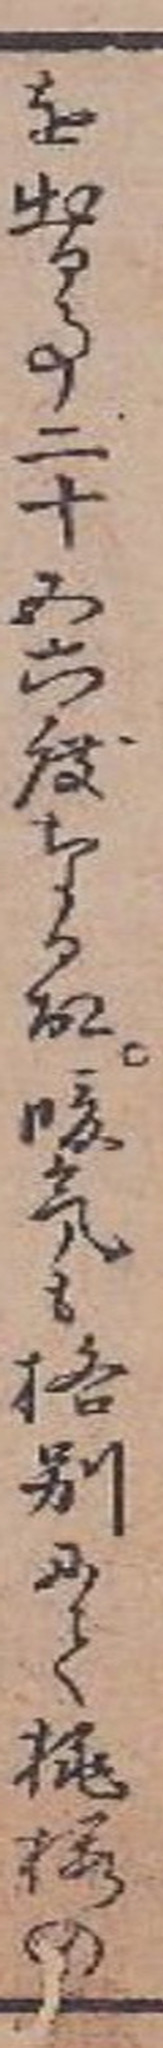を出る事二十五六度なる故、暖気も格別にて桃桜の
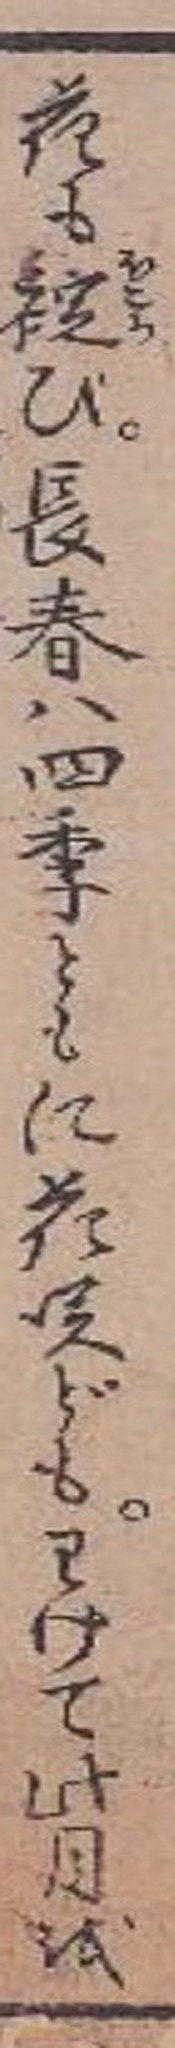花も綻び、長春は四季ともに花咲ども、わけて此月を
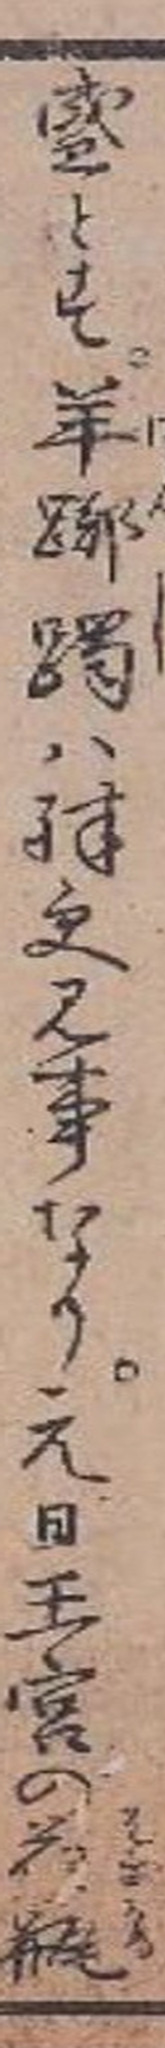盛とす、羊躑躅は殊更見事なり、元日王宮の花瓶
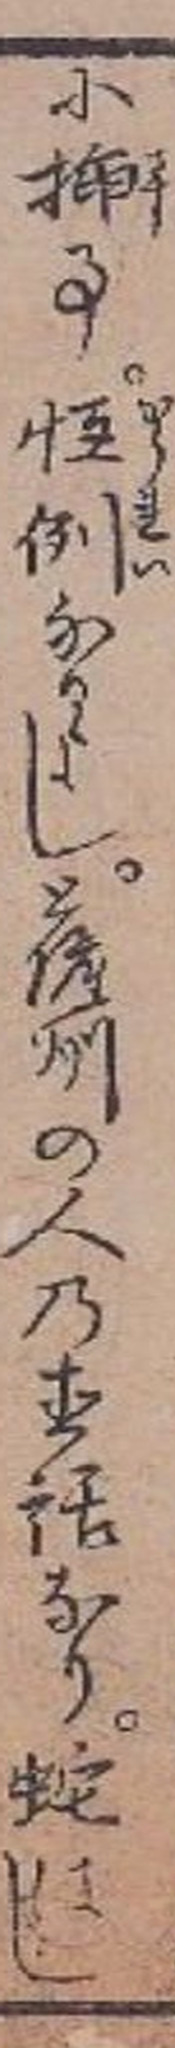に挿事、恒例なるよし、薩州の人の直話なり、蛇はし
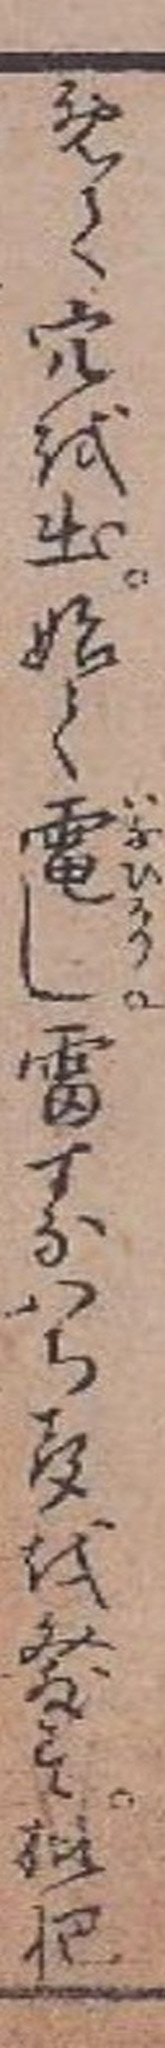めて穴を出、始て電し、雷すなはち声を発す、枇杷
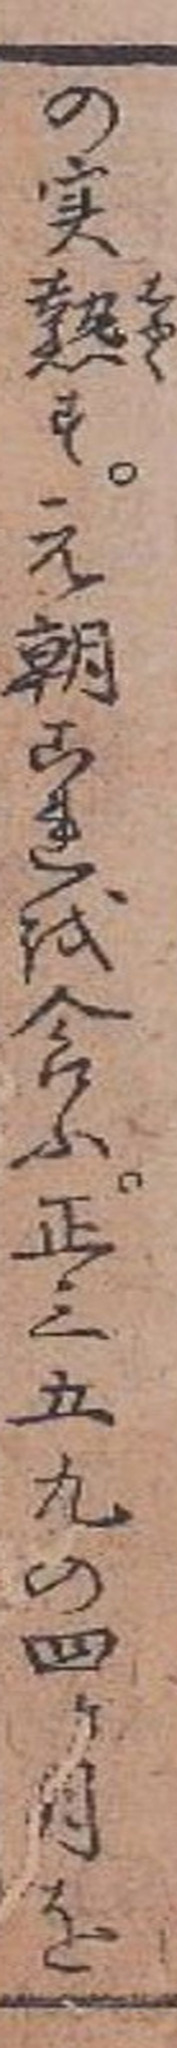の実熟す、元朝これを食ふ、正三五九の四月を

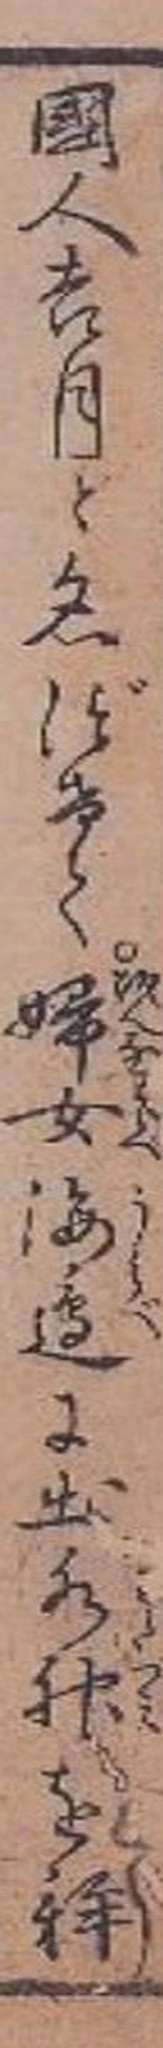国人吉月と名づけて、婦女海辺に出水神を拝
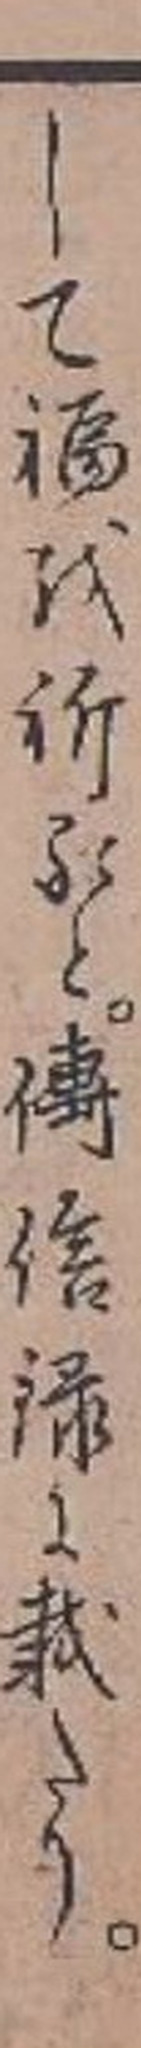して福を祈ると、伝信録に載たり、
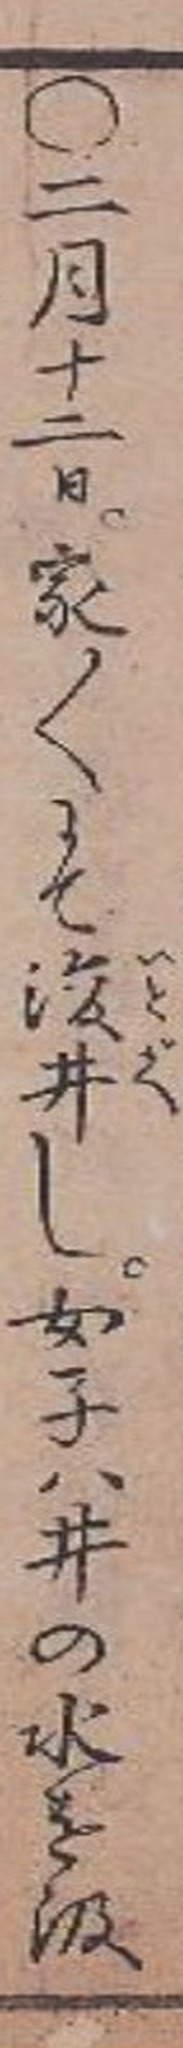○二月十二日、家〳〵にて浚井し、女子は井の水を汲
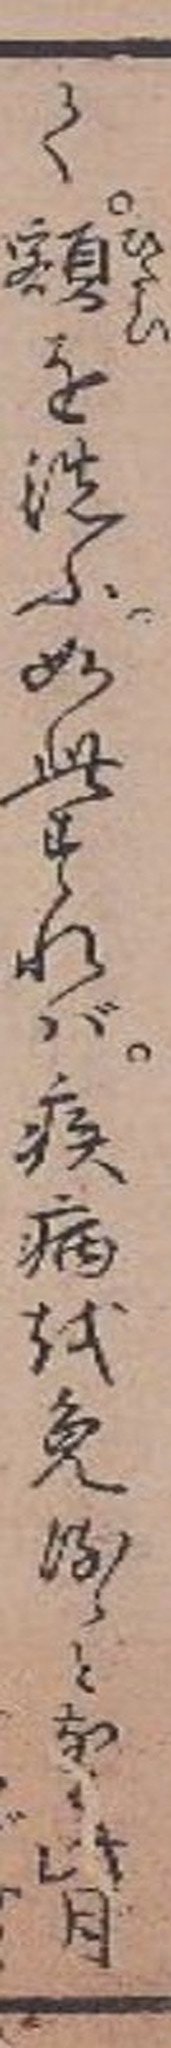て、額を洗ふ、如此すれば、疾病を免るゝとなり此月
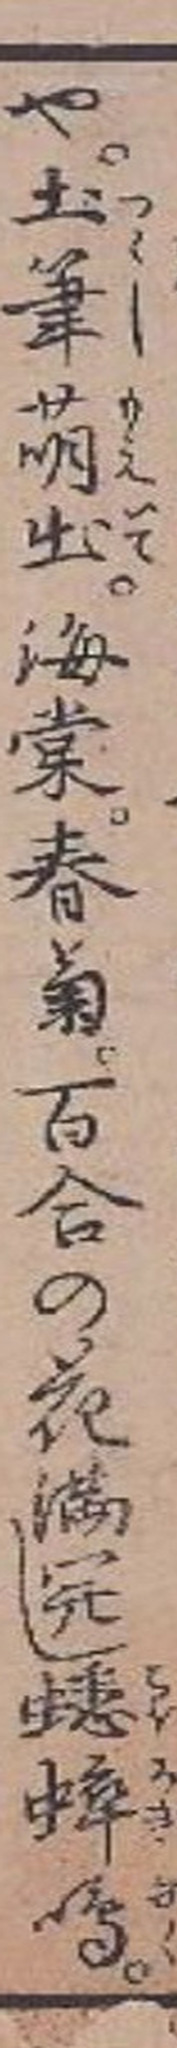や、土筆萌出、海棠、春菊、百合の花満開し蟋蟀鳴、
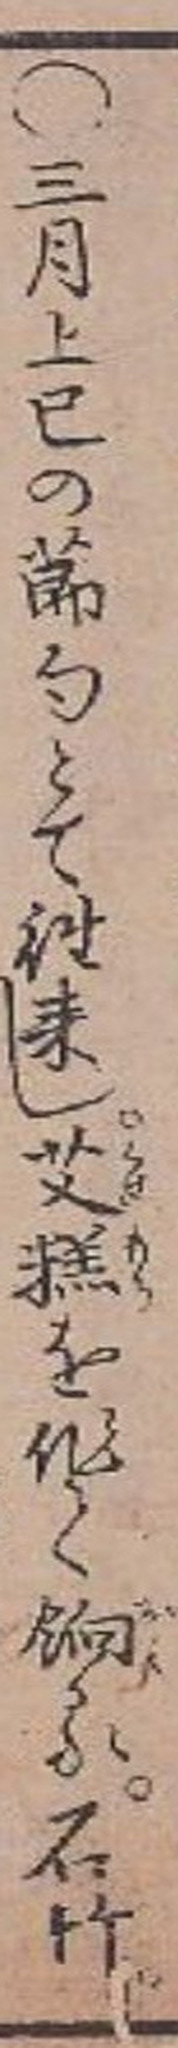○三月上巳の節句とて往来し、艾糕を作て餉る。石竹、
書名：琉球談
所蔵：University of the Ryukyus Library
